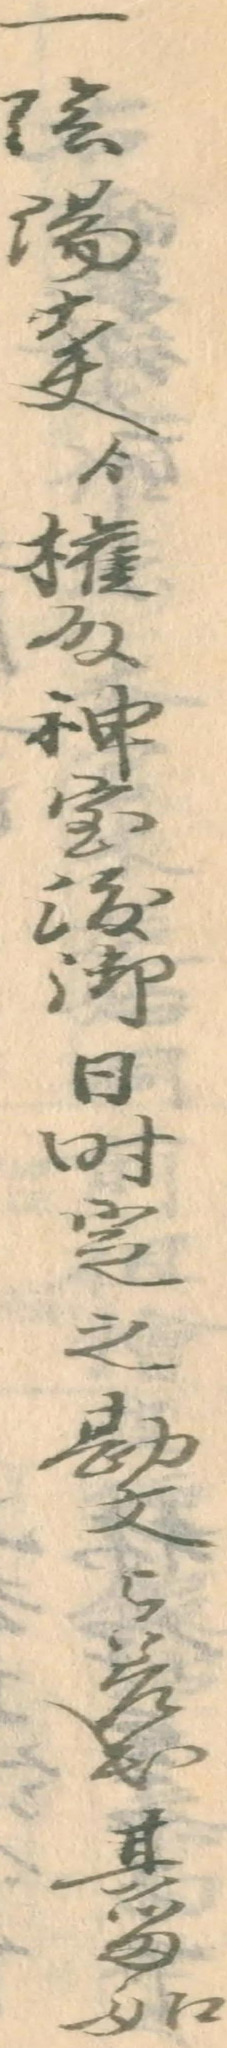一陰陽大夫ゟ権殿神宝渡御日時定之勘文被差出其留如
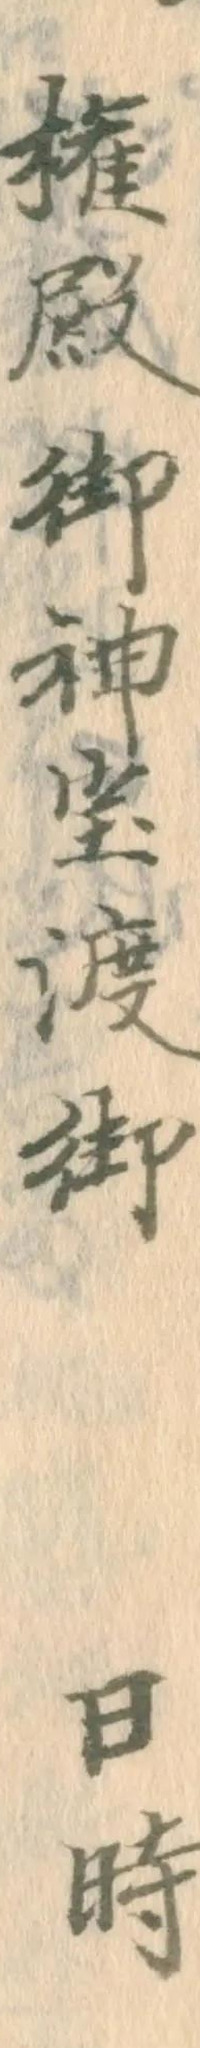權殿御神宝渡御日時
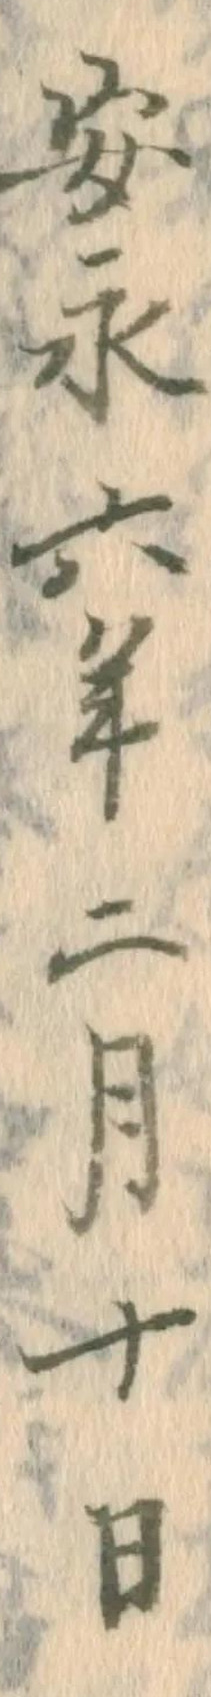安永六年二月十日
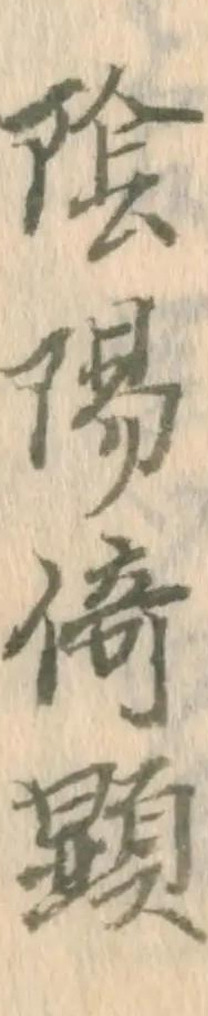陰陽倚顕
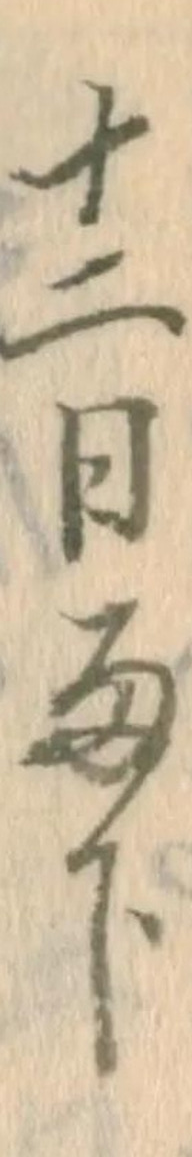十二日雨下
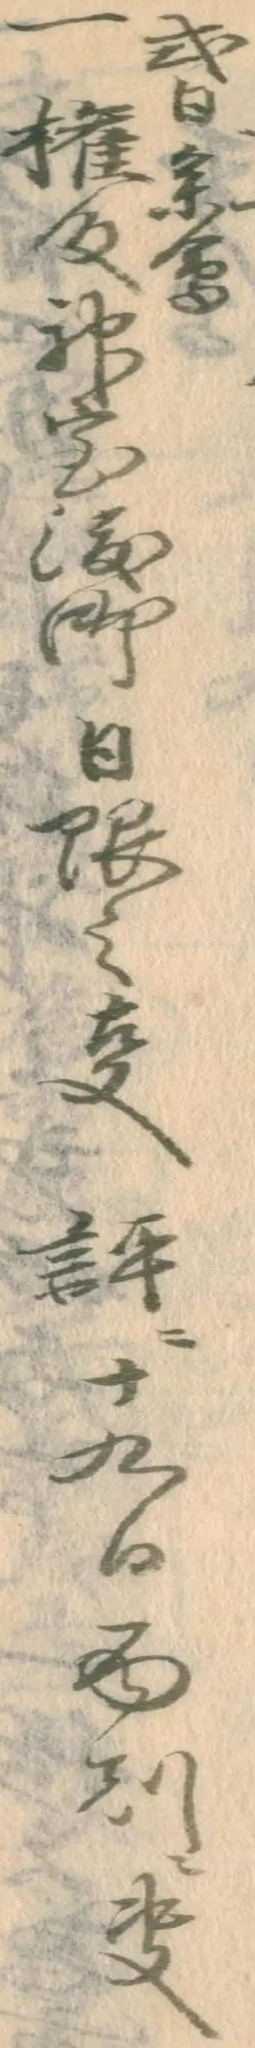一権殿神宝渡御日限之事評ニ十九日酉刻ニ決
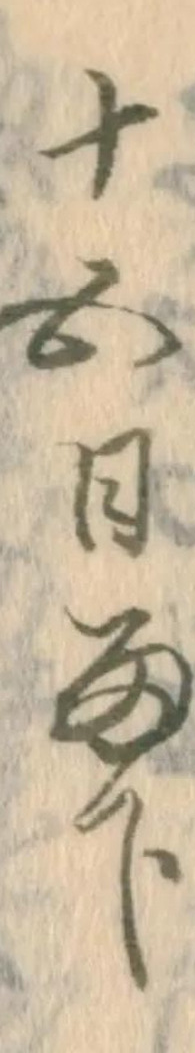十五日雨下
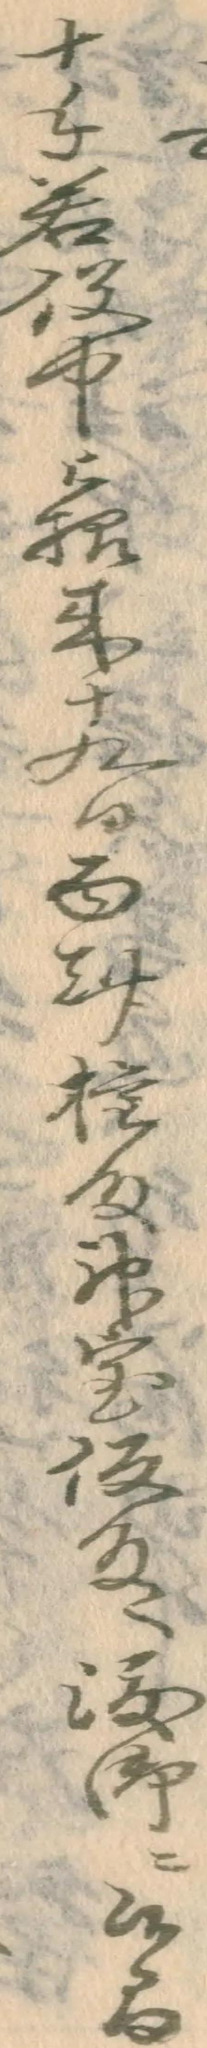一十手若役中被招来十九日酉刻権殿神宝仮殿へ渡御ニ候間
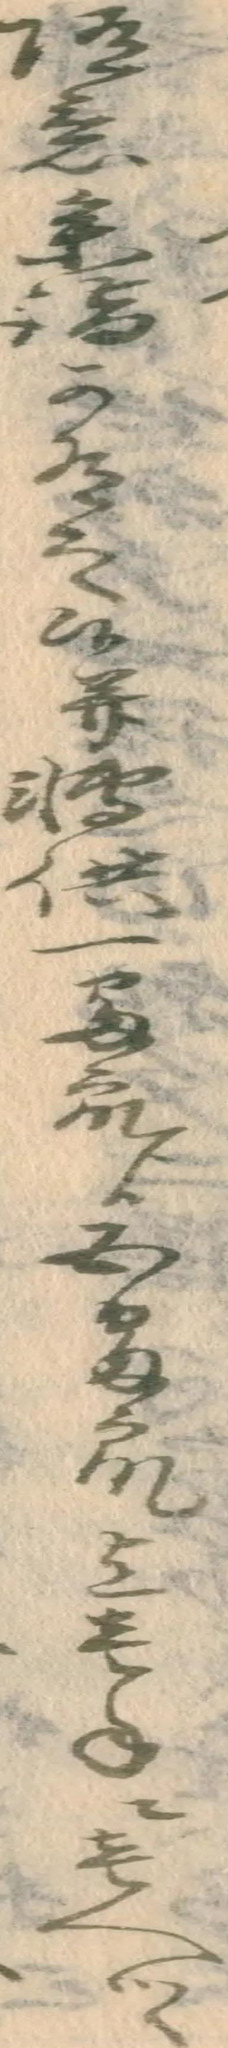随意参詣可有之候并伝供一番衆ゟ五番衆迄壱手ニ壱人ツヽ
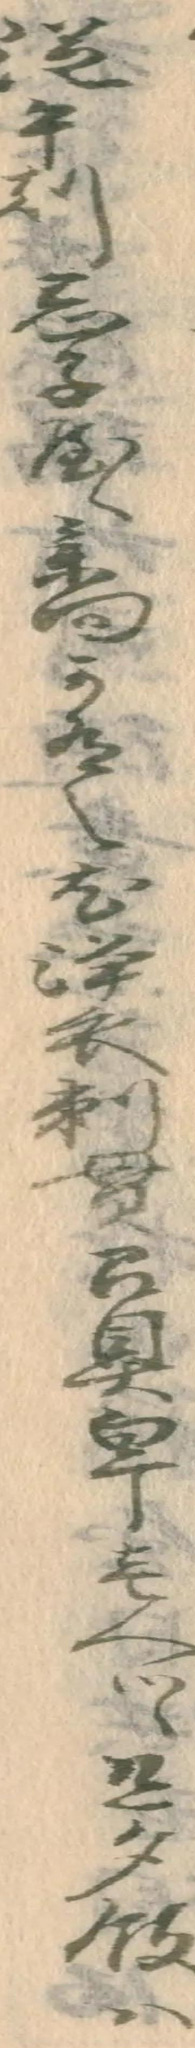従午刻忌子屋へ参向可有之尤浄衣剃貫召具白丁壱人ツヽ且夕飯ハ
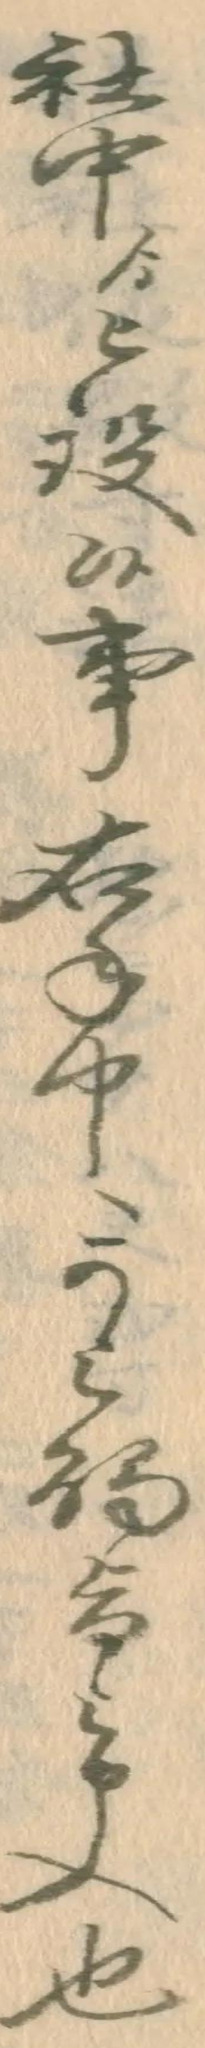社中ゟ被設候事右手中へ可被触旨被申入也
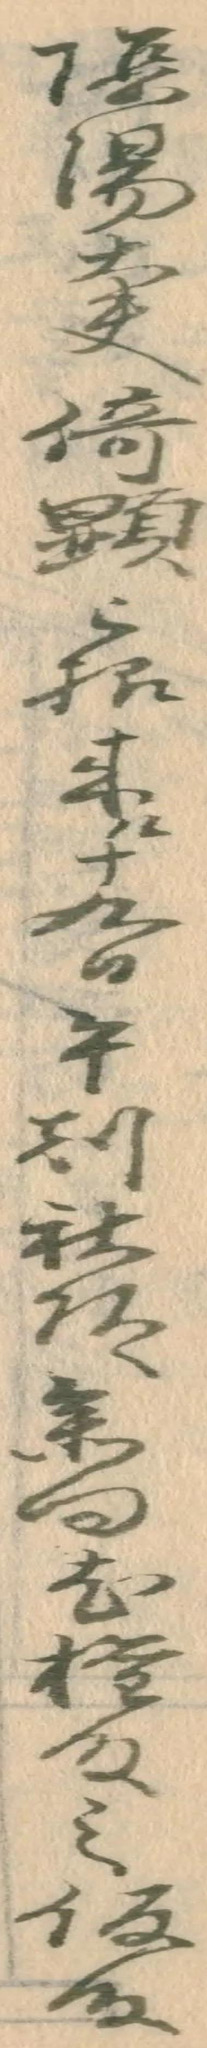一陰陽大夫倚顕被招来ル十九日午刻社頭へ参向尤権殿之仮殿
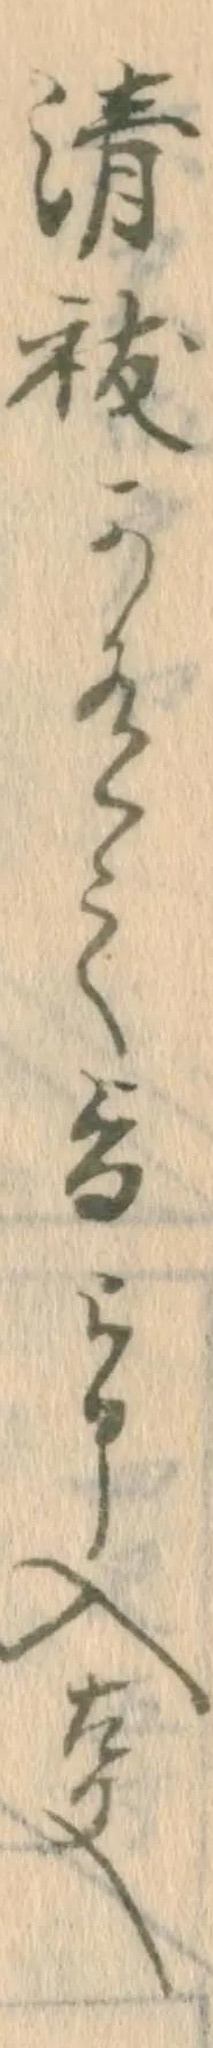清祓可有之旨被申入事
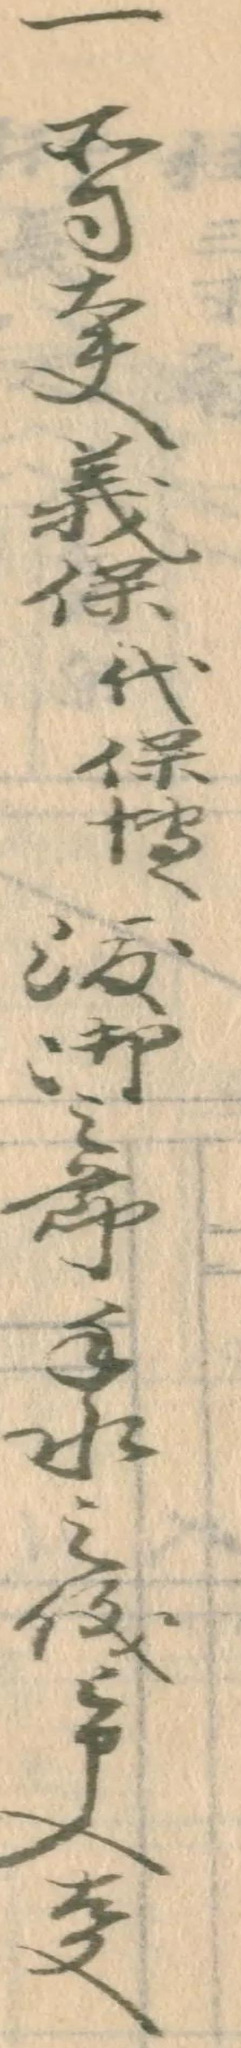一所司大夫義保代保博へ渡御之節手水之儀被申入事
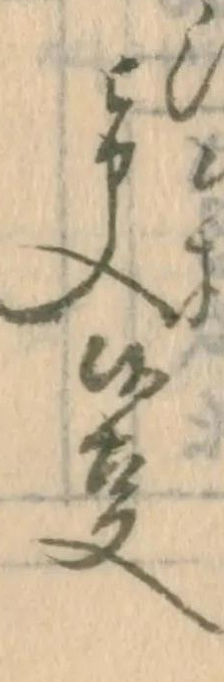被申入候事
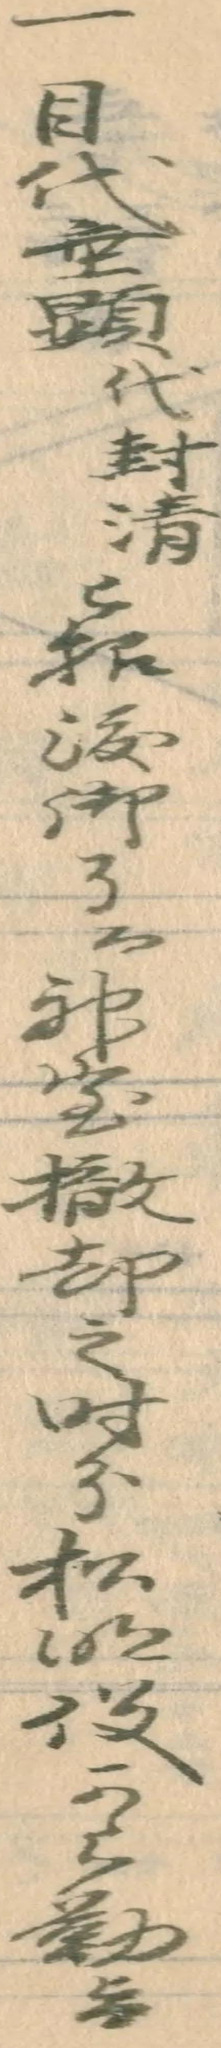一目代垂顕代封清被招渡御了而神宝撤却之時分松明役可被勤旨
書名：賀茂社記録. 第17冊
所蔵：国立国会図書館 National Diet Library, JAPAN
